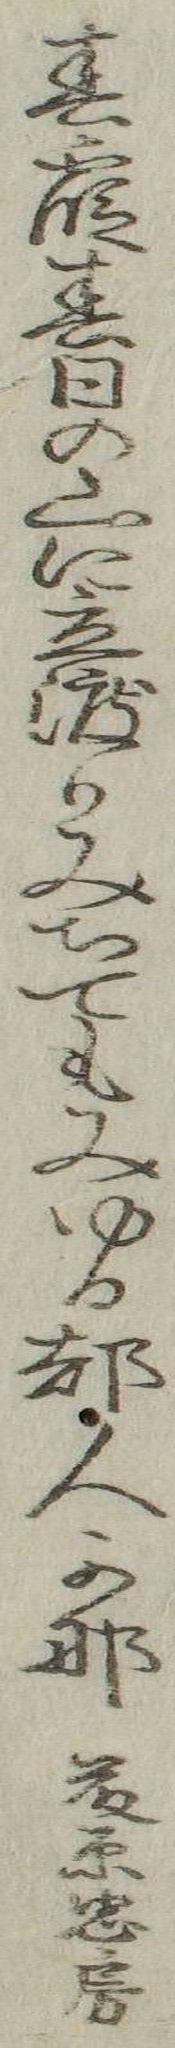仝春霞春日の山に立渡りみちてもみゆる都人かな藤原忠房
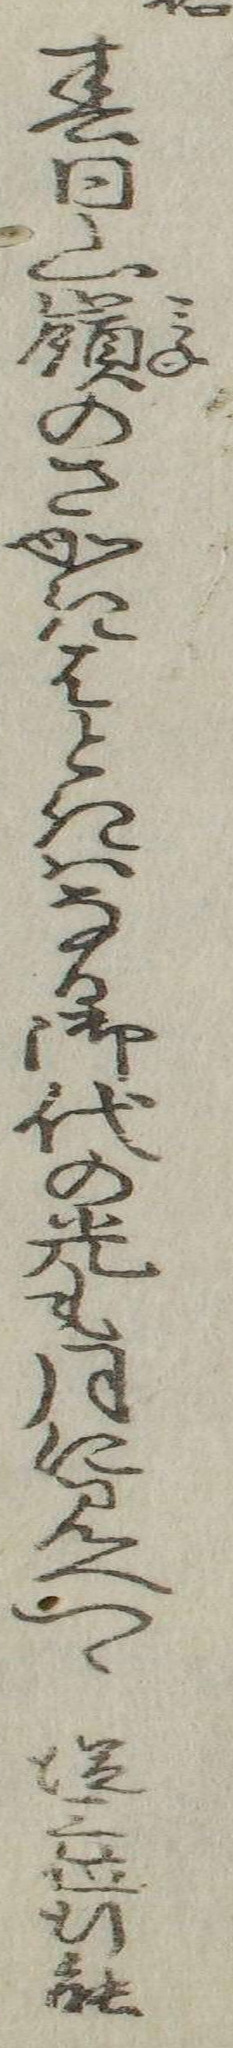後拾春日山嶺のさかきはときはなる御代の光も月に見へつゝ従三位行能

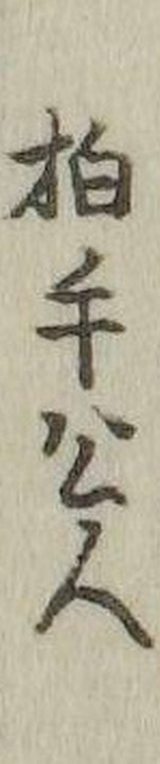拍手公人
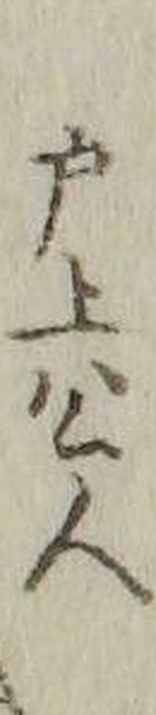戸上公人

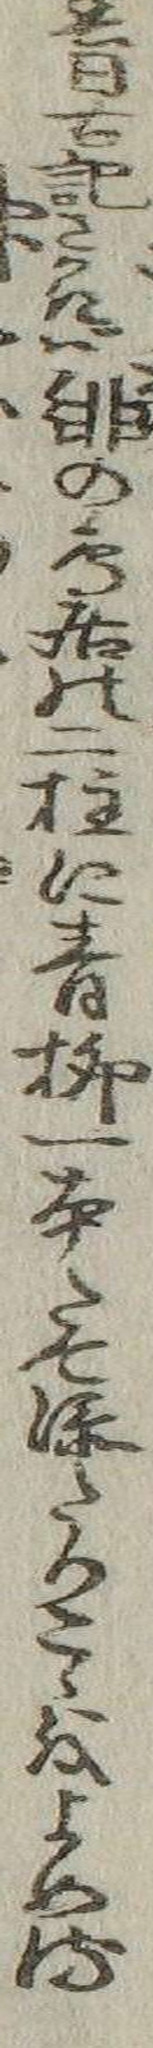春日古記緋の鳥居二柱青栁一本たて添たりこゝをよめる
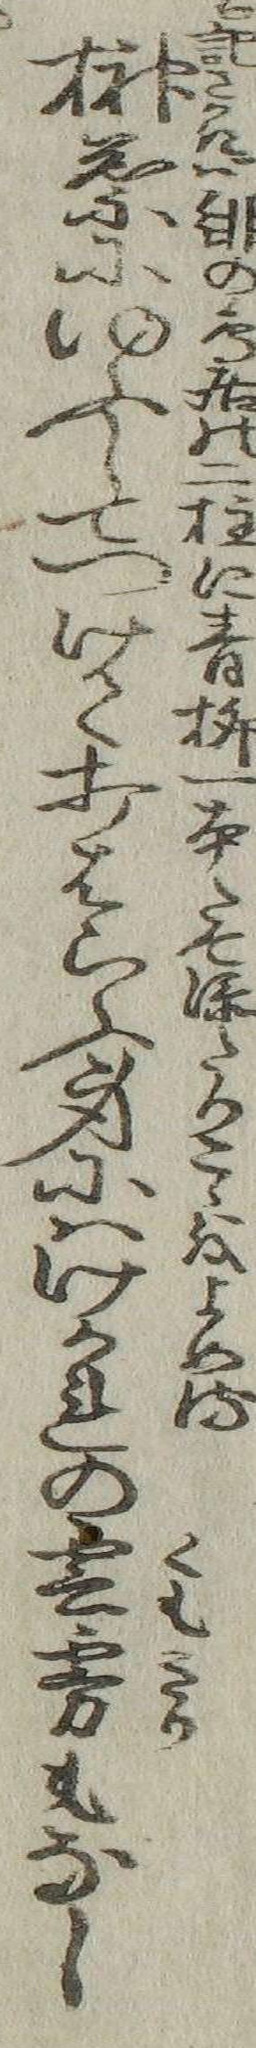榊葉にゆふしてつけて打はらふ身にはけかれの雲雾もなし
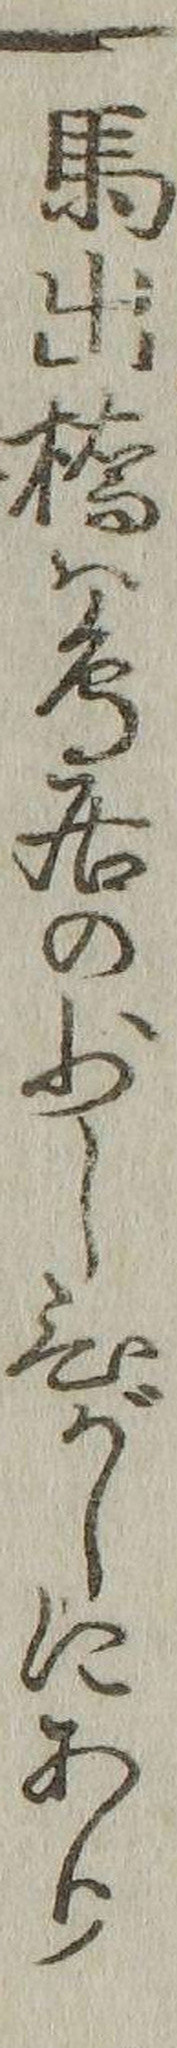馬出槗は鳥居の少しひがしにあり
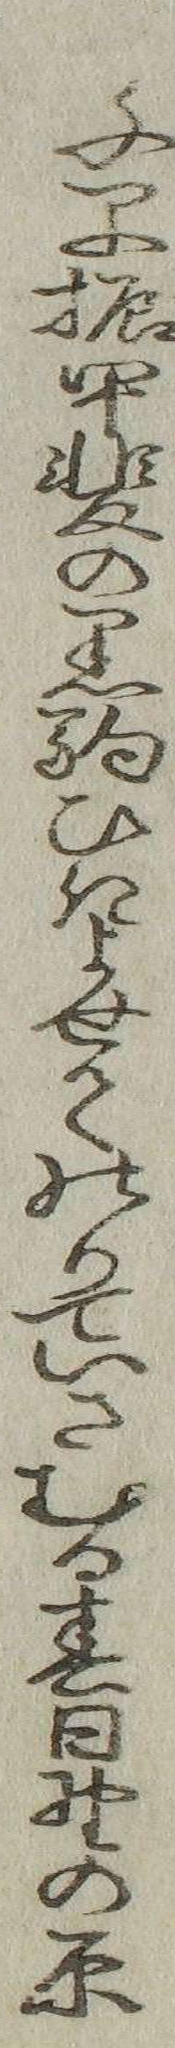千早振甲斐の黒駒ひきよせてのりていさむる春日野の原
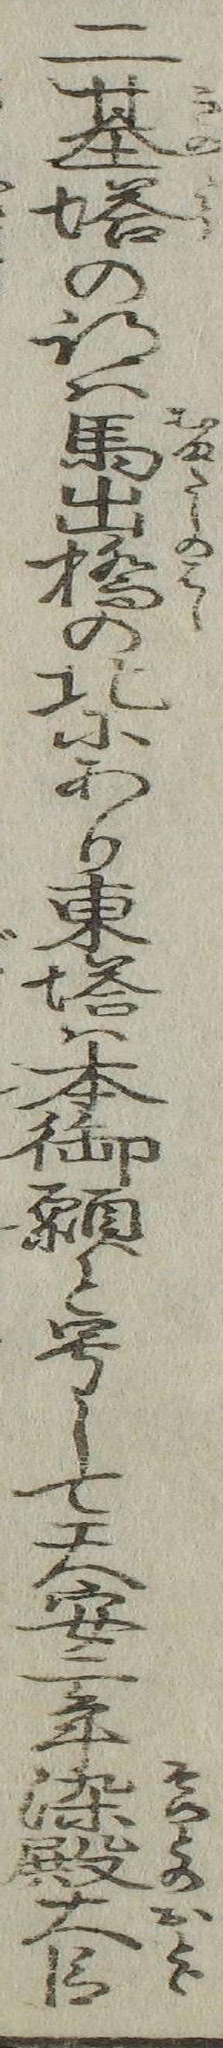二基塔の跡は馬出橋の北にあり東塔は本御願と号して天安二年染殿大臣
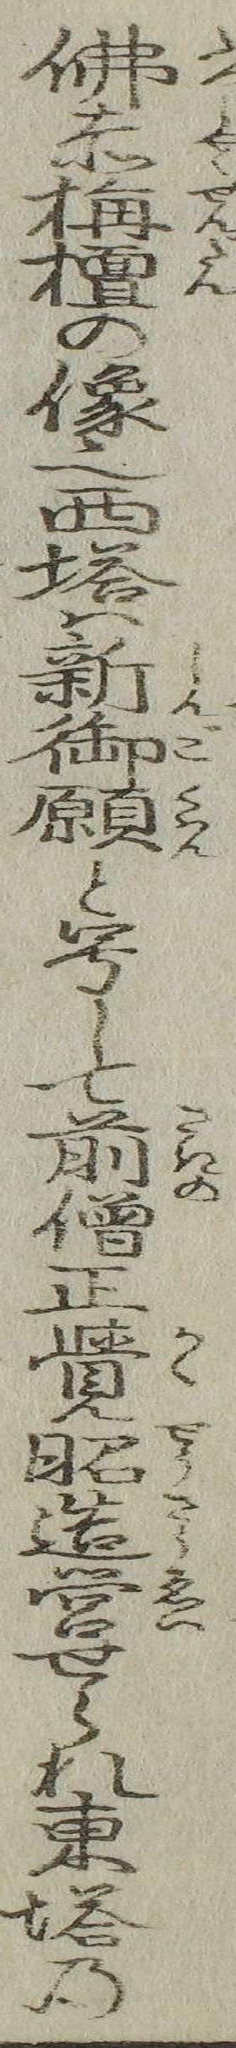佛赤栴檀の像也西塔は新御願と号して前僧正覺昭造営せられ東塔の
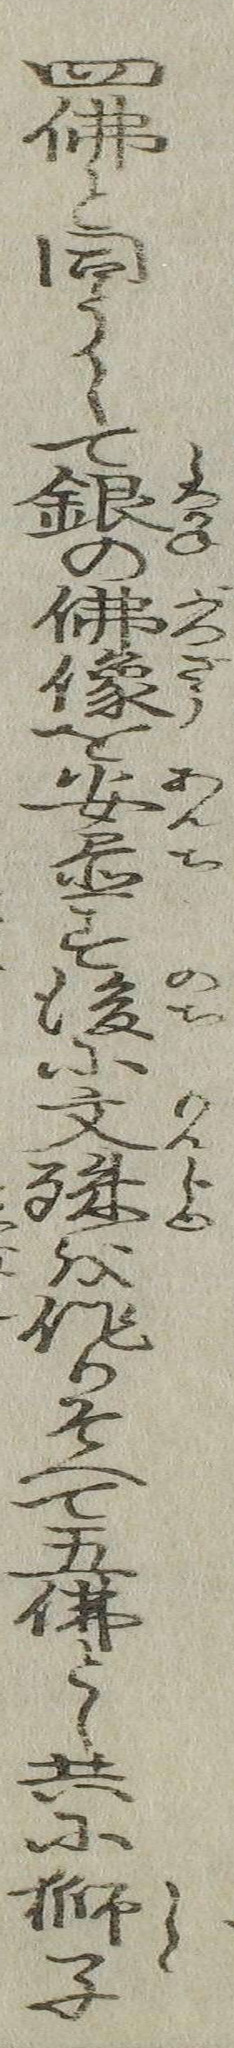四佛と同うして銀の佛像を安置す後に文殊を作りそへて五佛とし供に師子
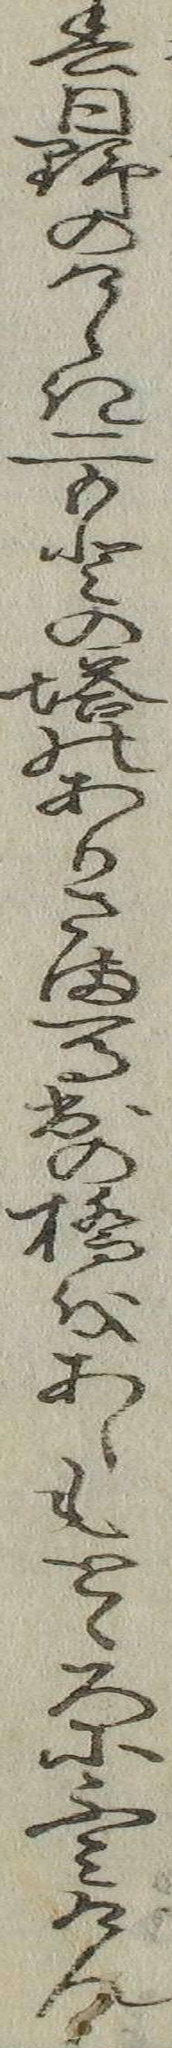春日野のけしき二もとの塔のありさま馬出の槗をあしもとゝろにふみけん
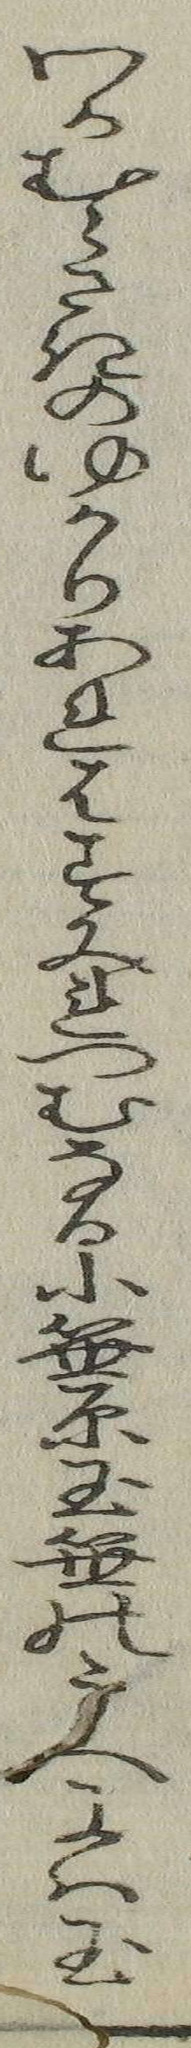わかむらさきのゆかりあれはすみれつむなる小笠原玉笹のうへには玉
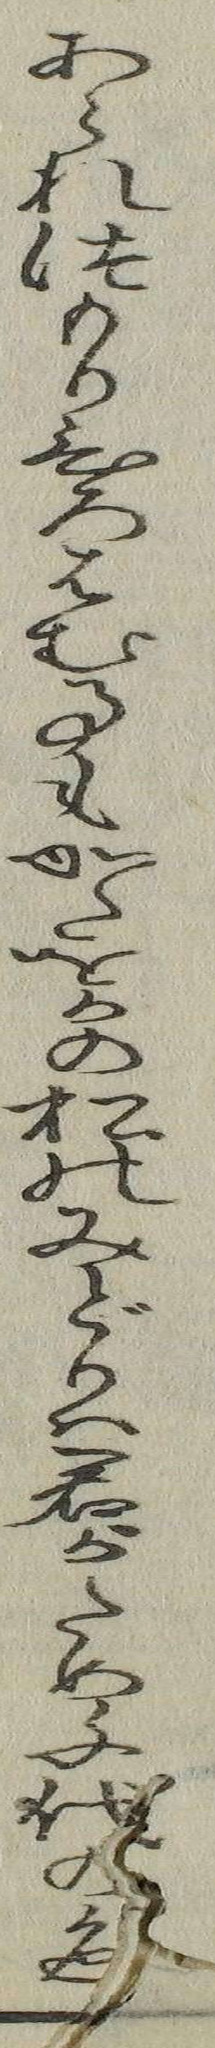あられつもりひろはむ事もかたをかの松のみどりは君がため千代の色
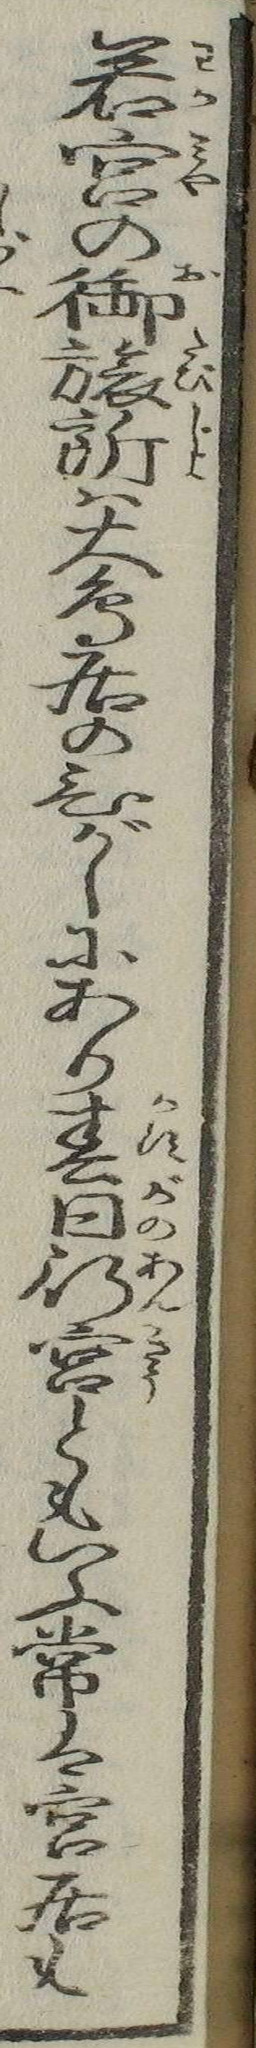若宮の御旅所は大鳥居のひがしにあり春日行宮ともいふ常は宮居も
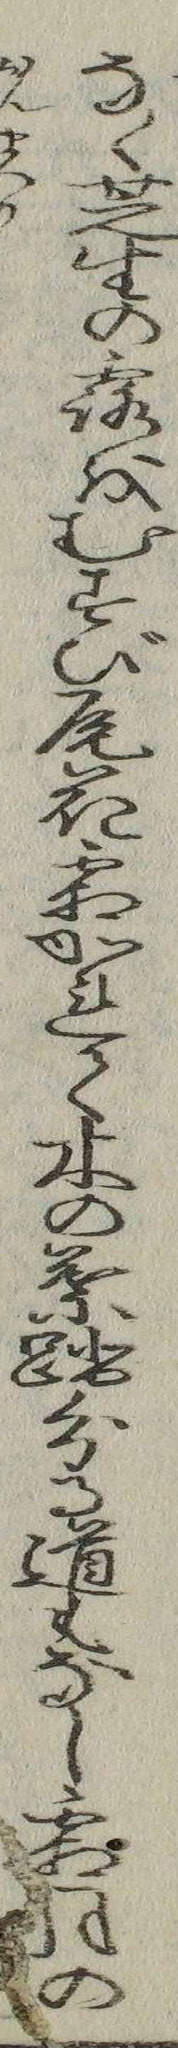なく芝生の露をむすび尾花霜かれて木の葉踏分る道もなし霜月の
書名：大和名所圖會
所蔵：国文学研究資料館
